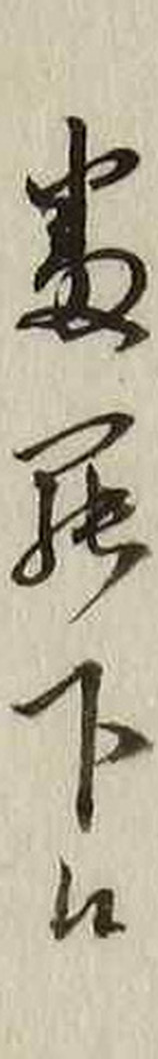番罷下候
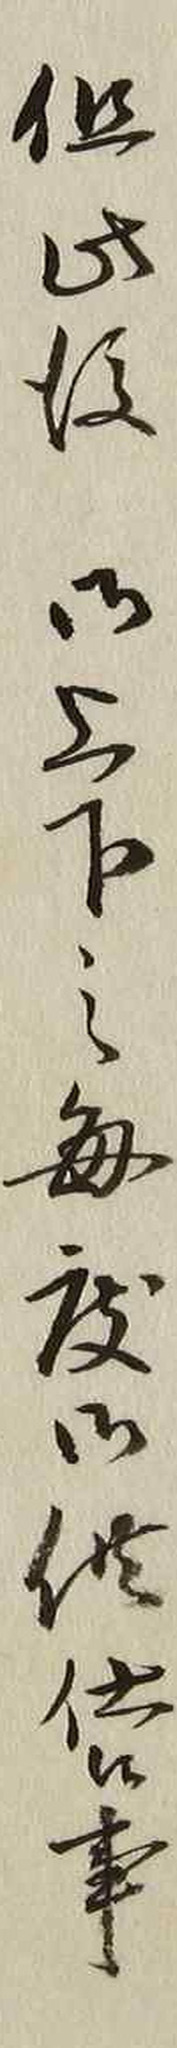但此後御上下之毎度御供仕候事
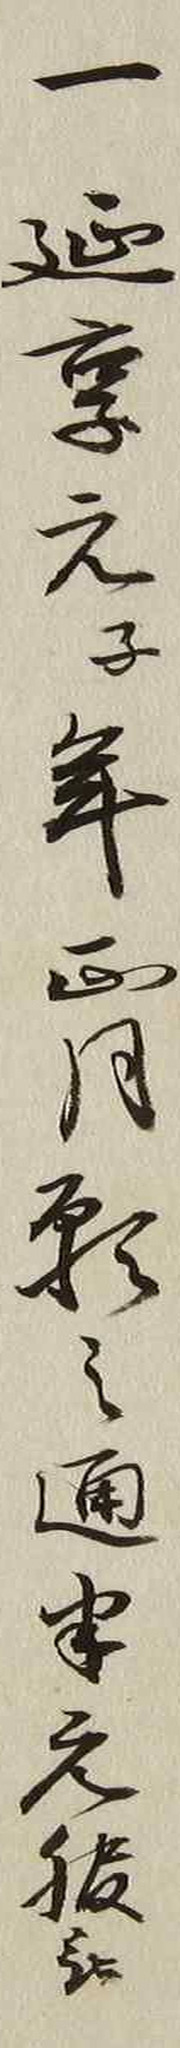一延享元子年正月願之通半元服被
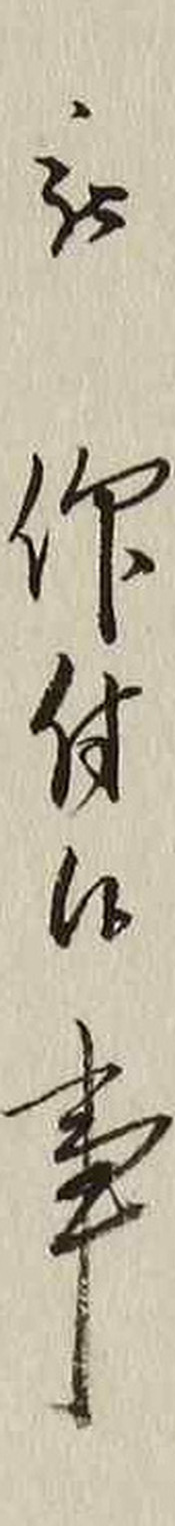被仰付候事
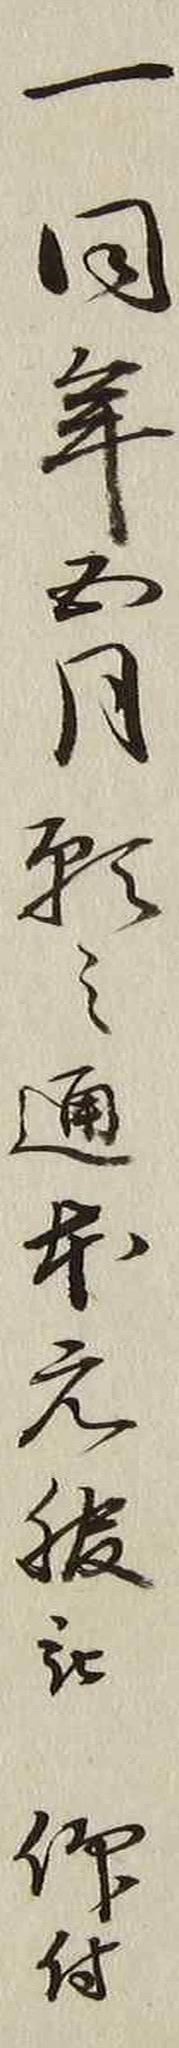一同年五月願之通本元服被仰付
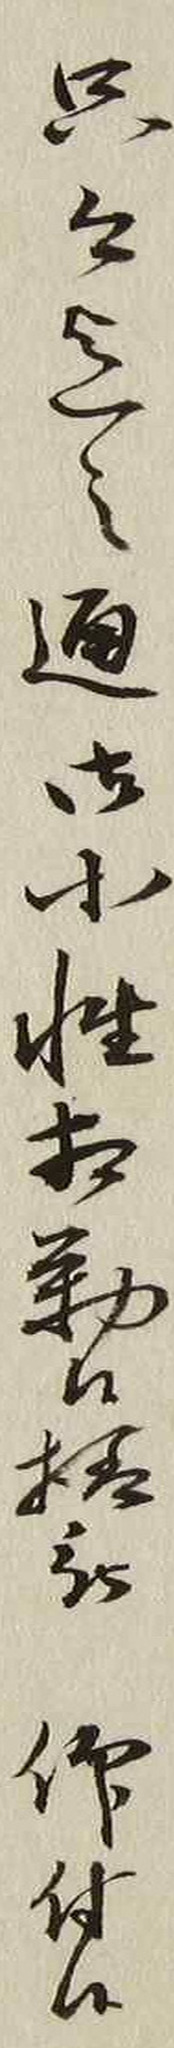只今迄之通御小姓相勤候様被仰付候
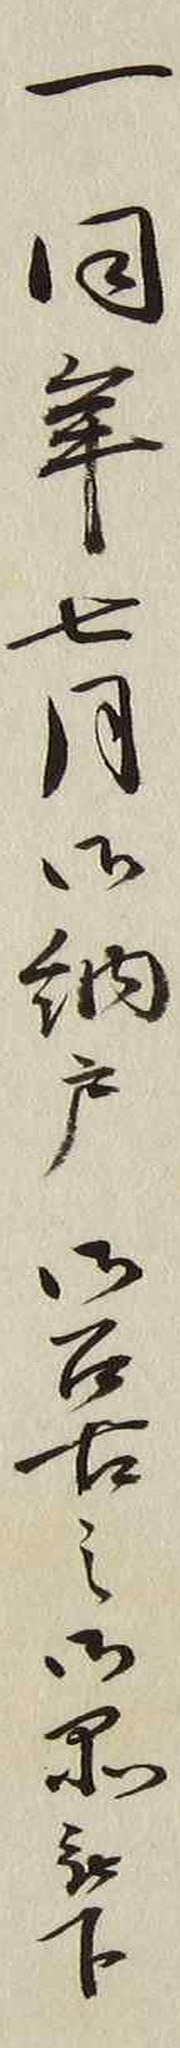一同年七月御納戸御召古之御品被下
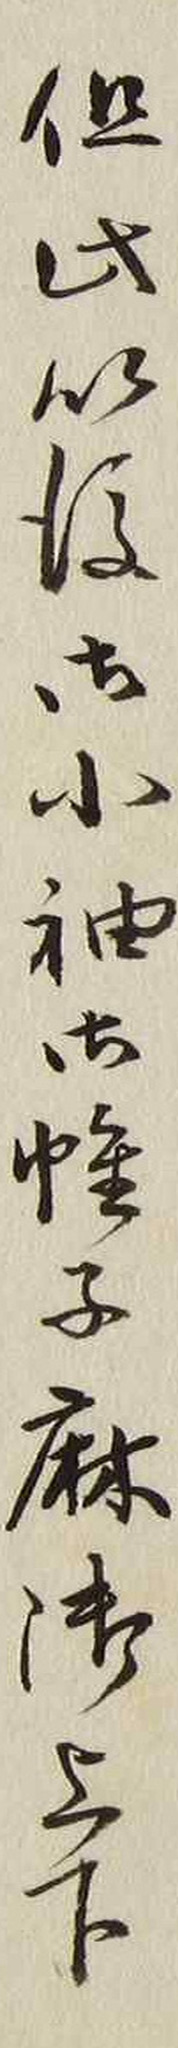但此以後御小袖御帷子麻御上下
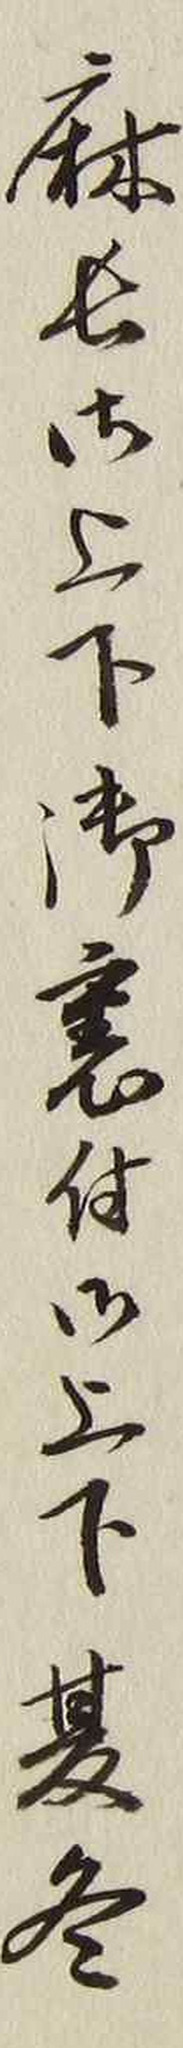麻長御上下御裏付御上下夏冬
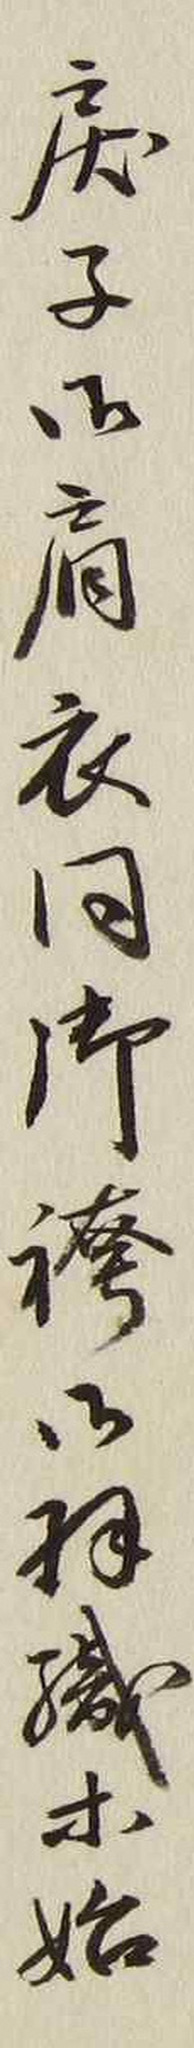戻子御肩衣同御袴御羽織等始

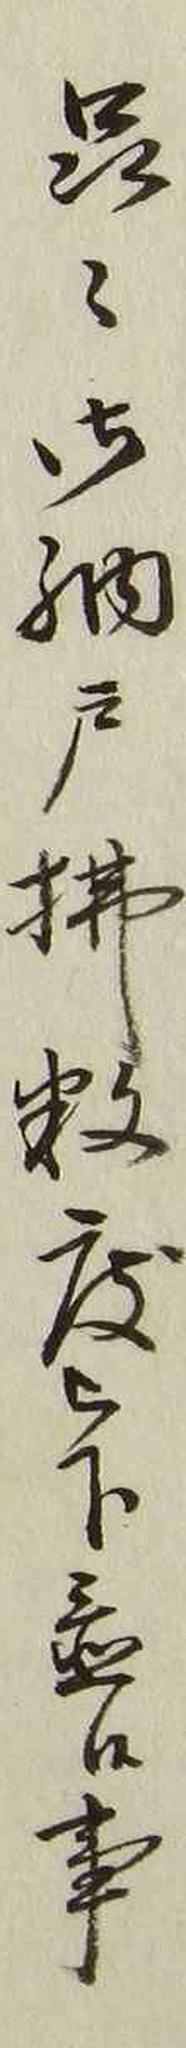品々御納戸払数度被下置候事
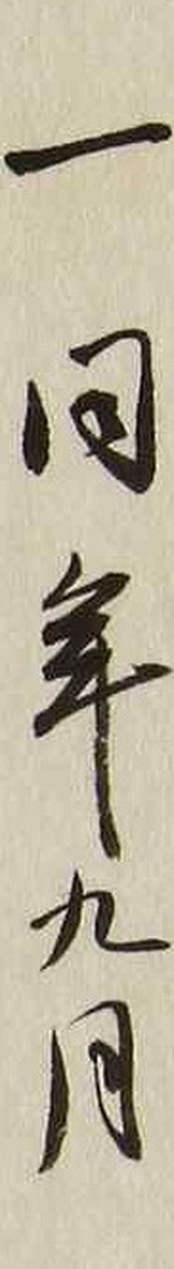一同年九月
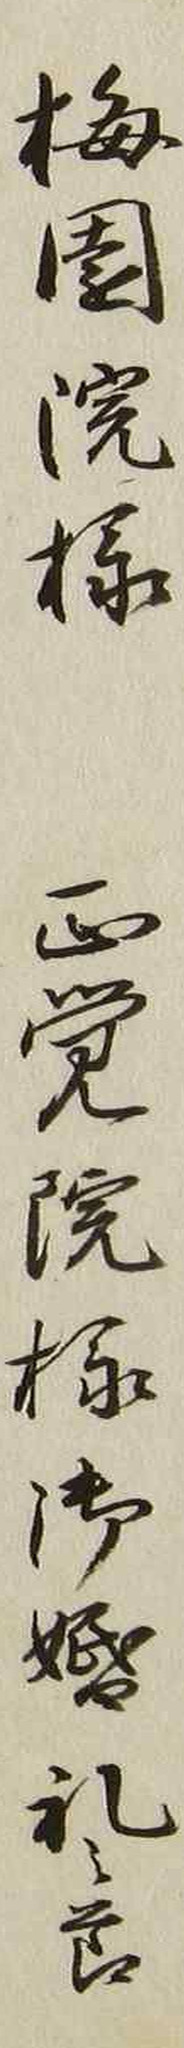梅園院様正覚院様御婚礼之節
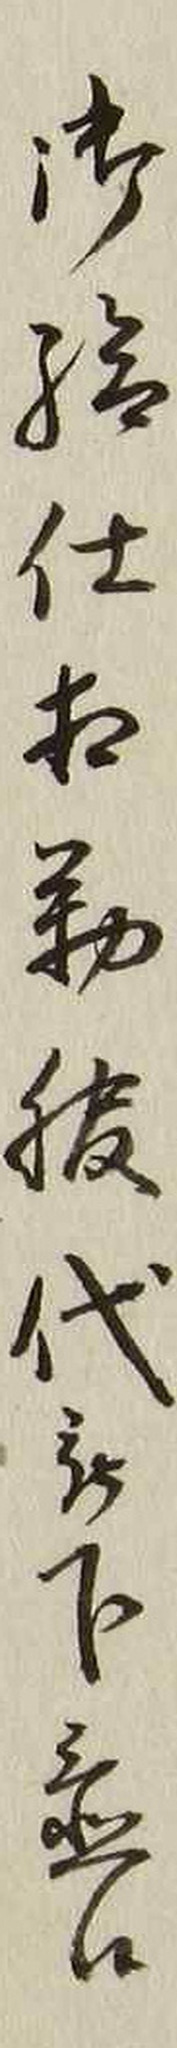御給仕相勤服代被下置候
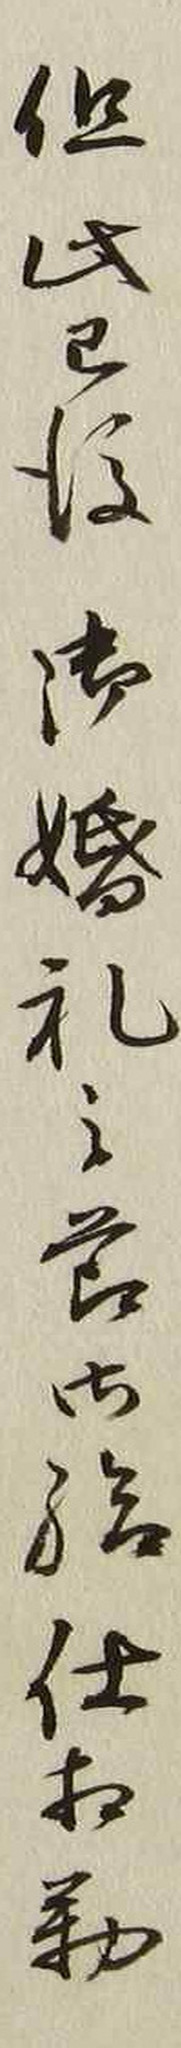但此已後御婚礼之節御給仕相勤
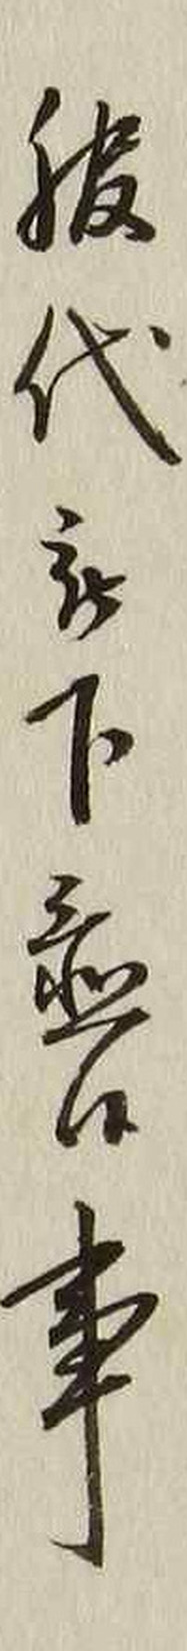服代下置候事
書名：諸士系譜　巻之160　な之部2
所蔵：会津若松市立会津図書館
